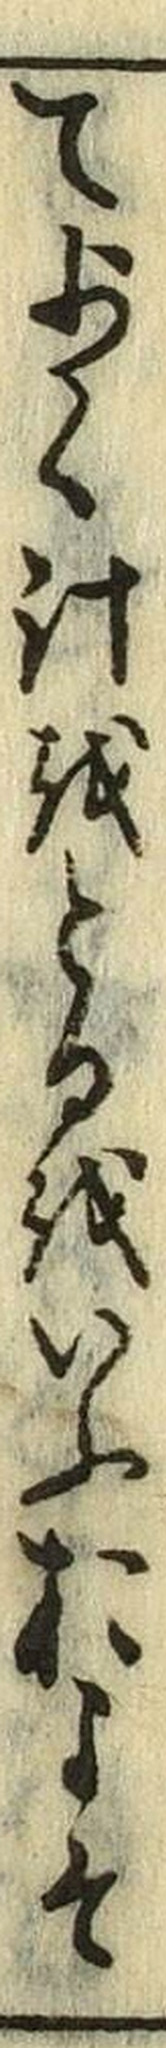て少く汁をとるをいふおよそ
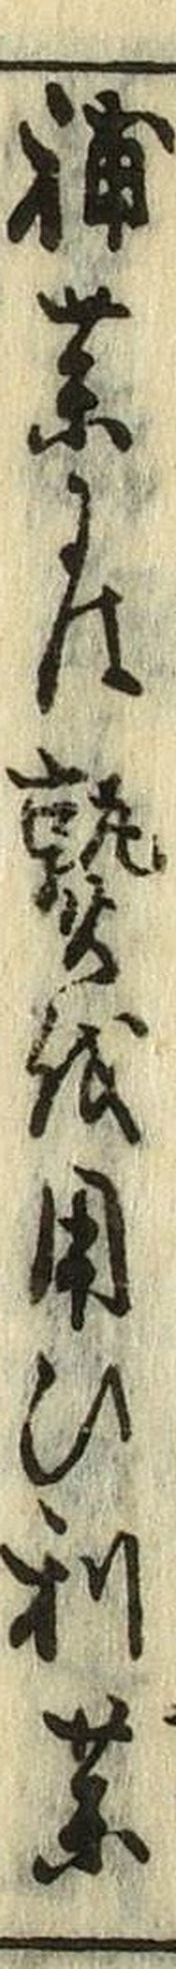補薬には熟を用ひ利薬
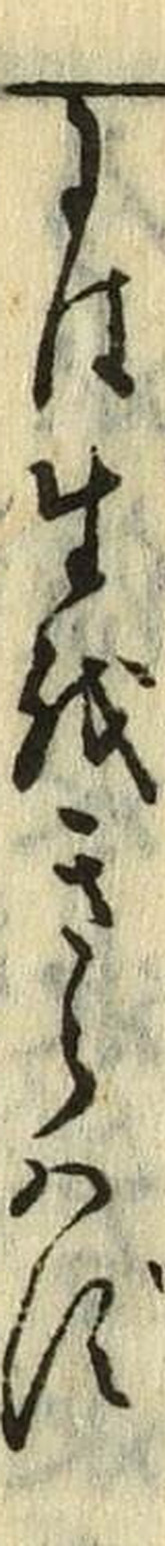には生をきらはず
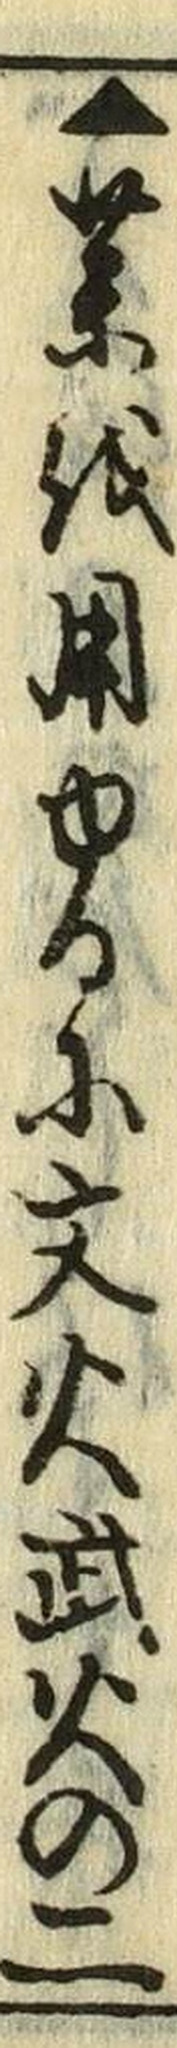▲薬を用ゆるに文火武火の二
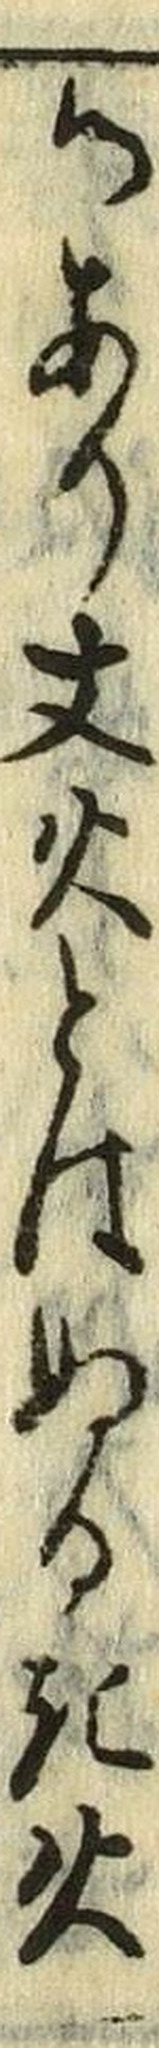ツあり文火とはぬるき火
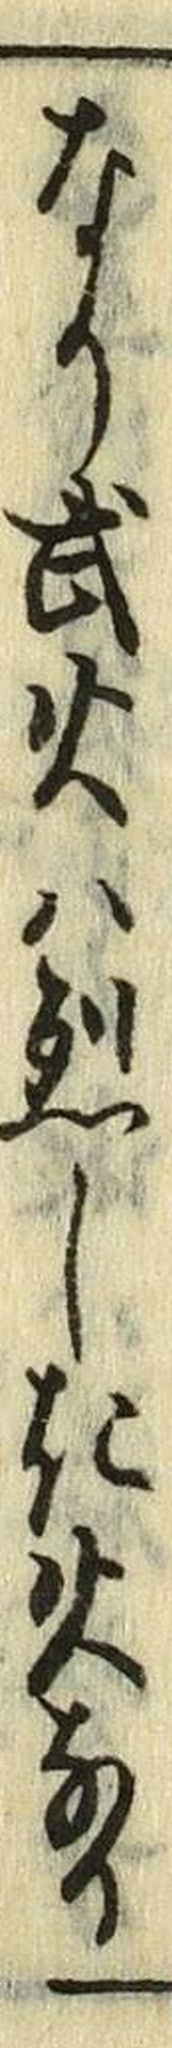なり武火は烈しき火なり
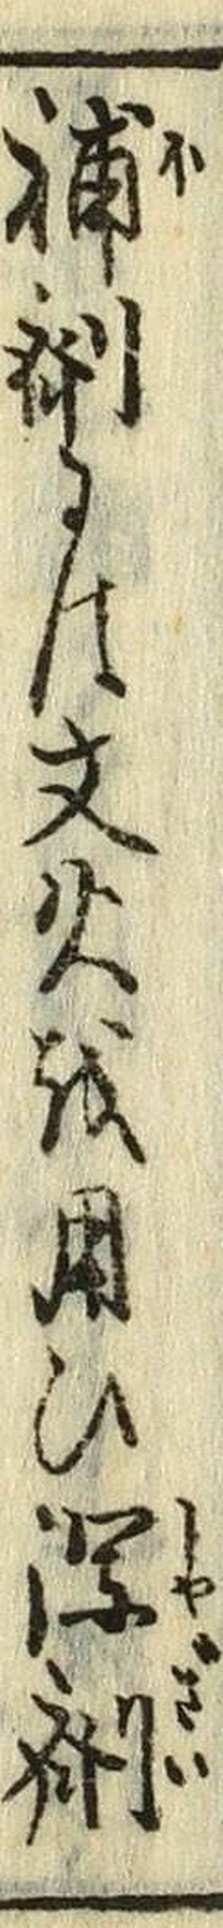補剤には文火を用ひ瀉剤
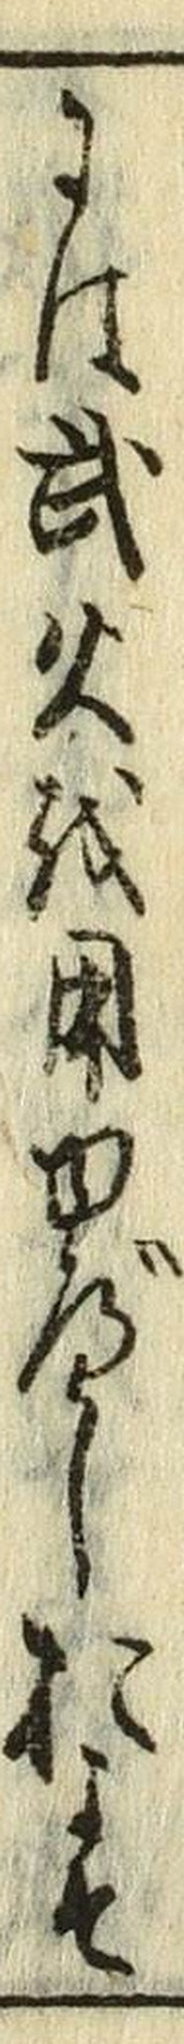には武火を用ゆべしおよそ
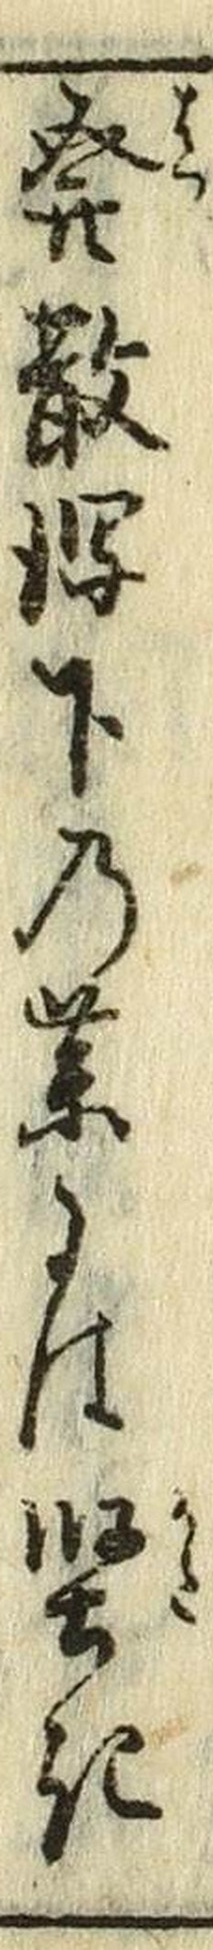発散瀉下の薬には堅き
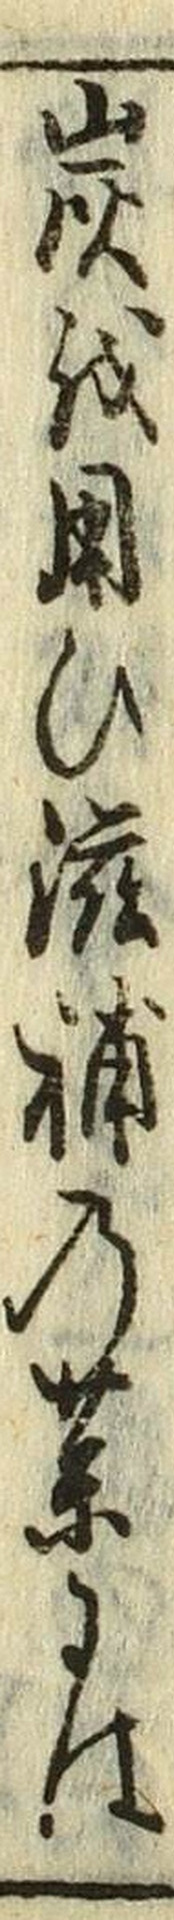炭を用ひ滋補の薬には
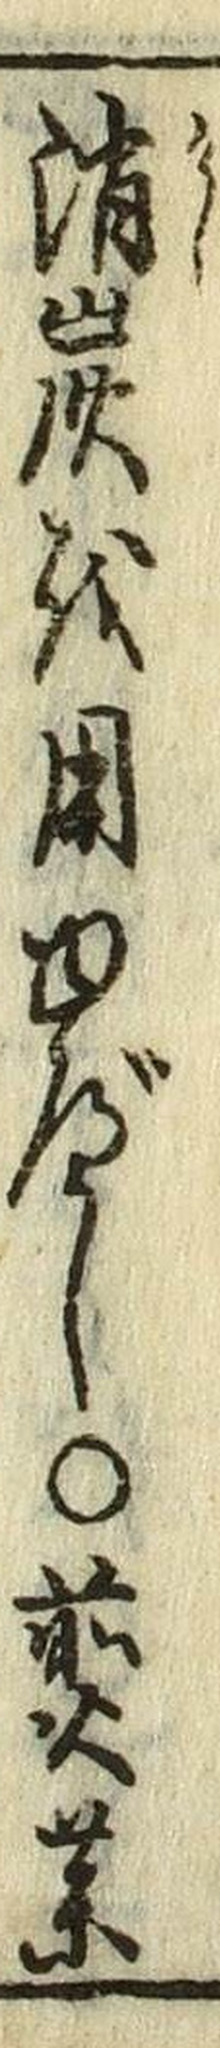消炭を用ゆべし○煎薬
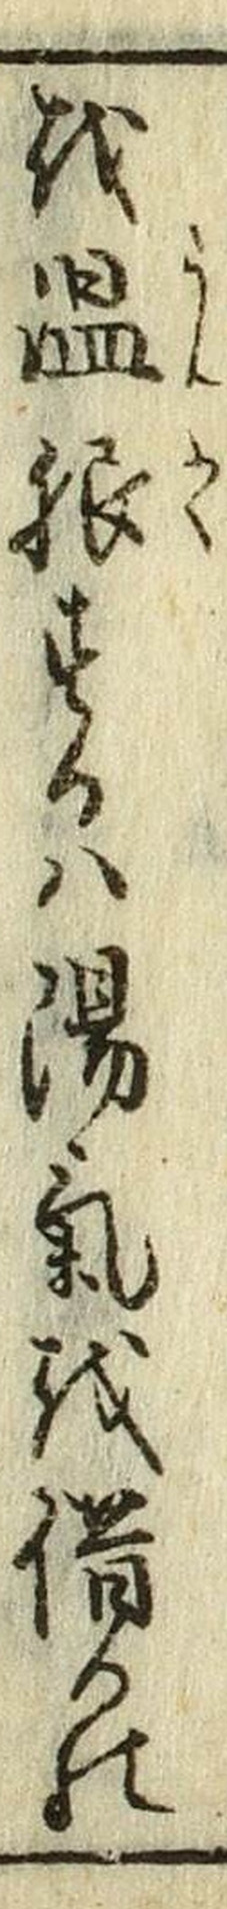を温服するは湯気を借るの
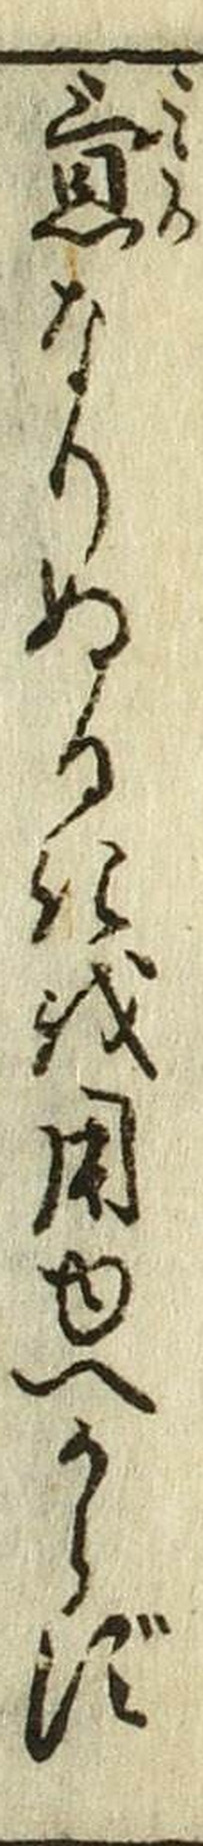意なりぬるきを用ゆへからず
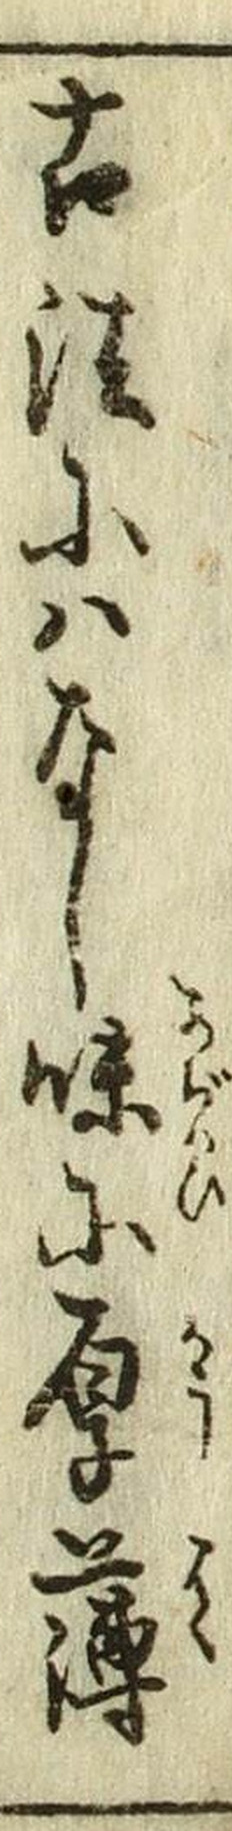古法にはなし味に厚薄
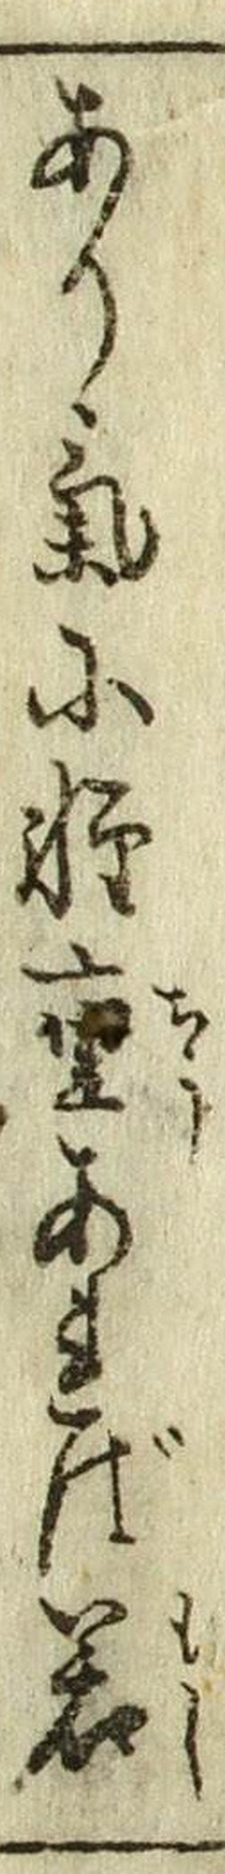あり気に軽重あれば若
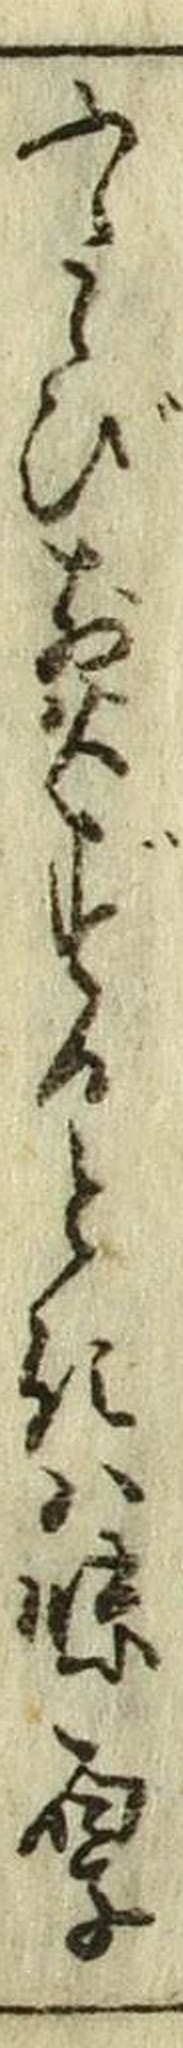ふたゝび煎ずるときは味厚
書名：居家養生記
